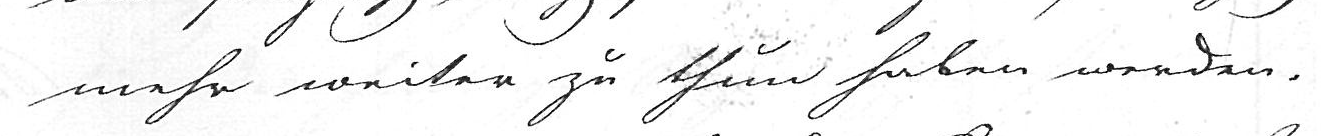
mehr weiter zu thun haben werden.
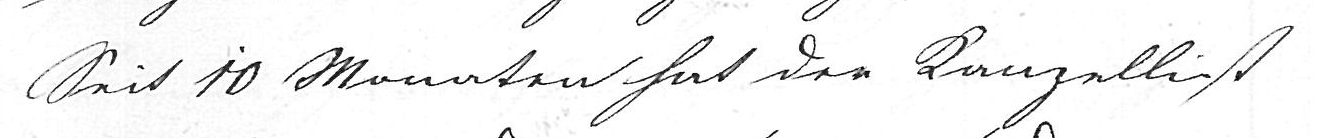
Seit 10 Monaten hat der Kanzellist
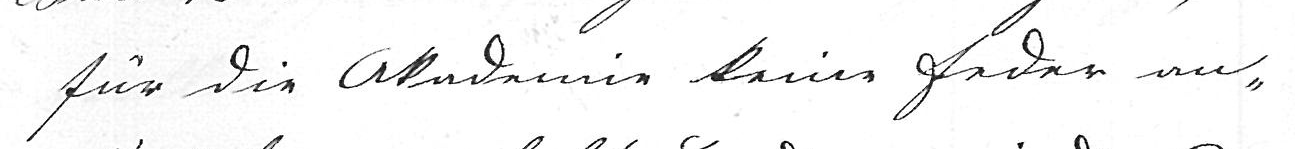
für die Akademie keine Feder an-
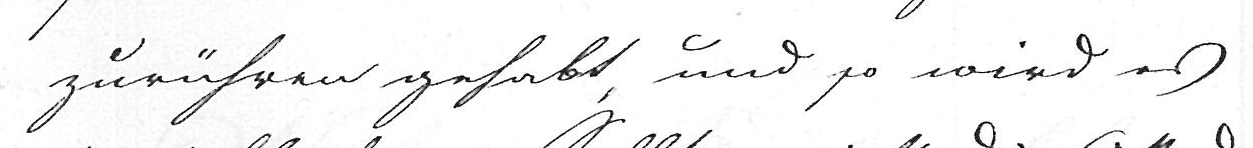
zurühren gehabt und so wird es
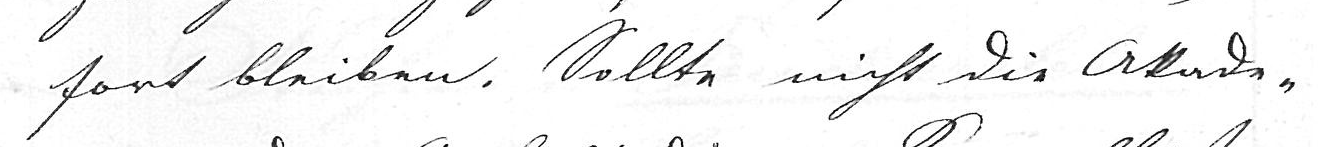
fort bleiben. Sollte nicht die Akade-
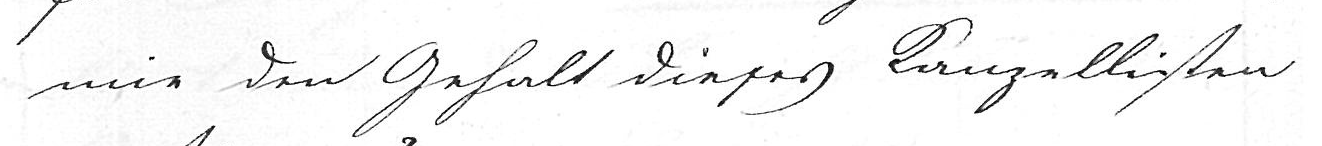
mie den Gehalt dieses Kanzellisten
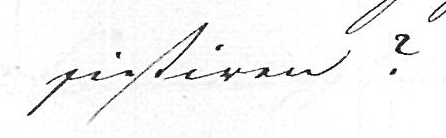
sistiren?
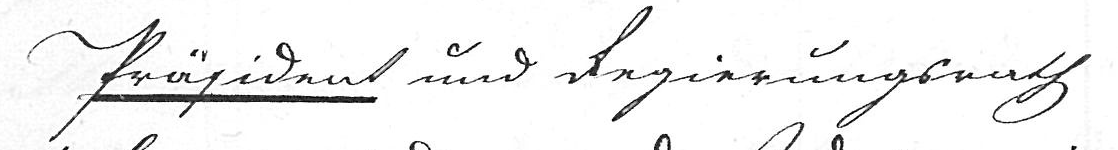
Präsident und Regierungsrath
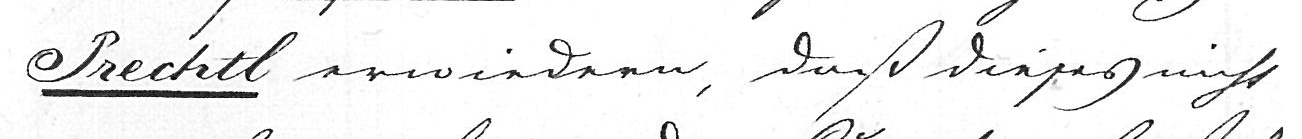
Prechtl erwiedern, daß dieses nicht
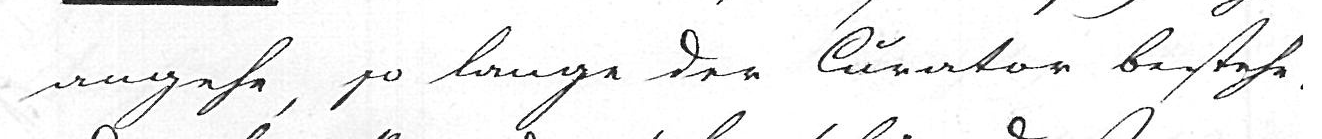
angehe, so lange der Curator bestehe.
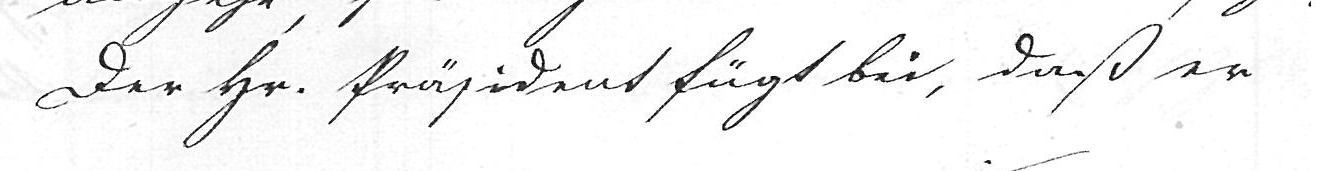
Der Hr. Präsident fügt bei, daß er
